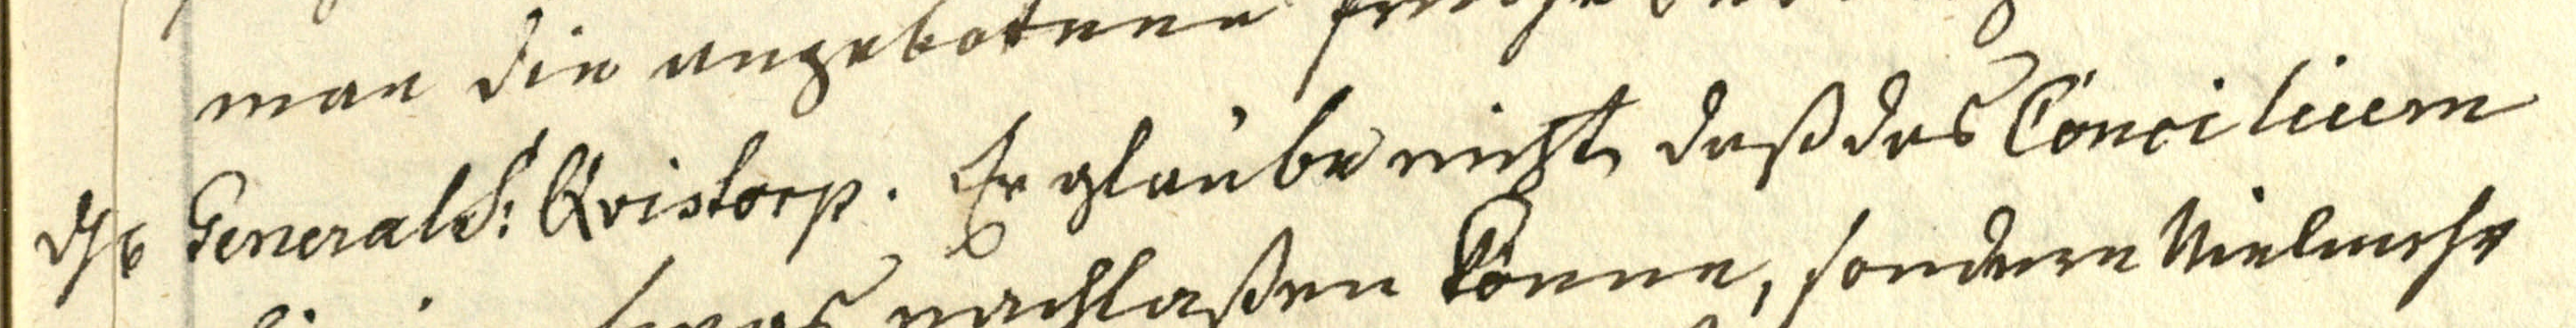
dh GeneralS. Quistorp. Er glaube nicht, daß das Concilium
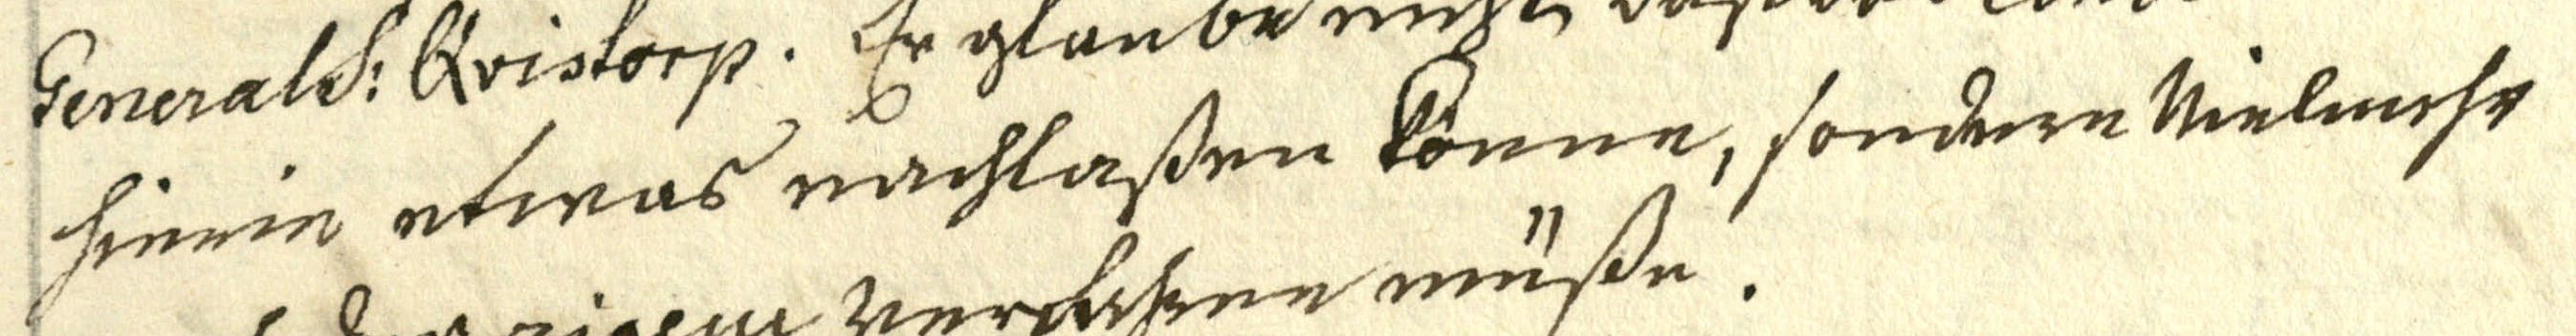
hierin etwas nachlaßen könne, sondern vielmehr
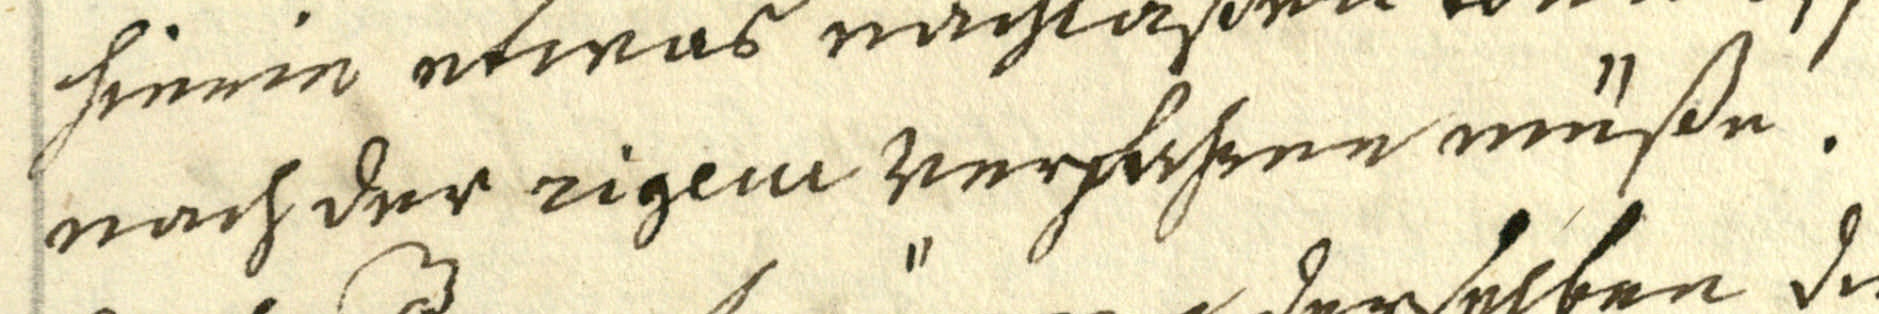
nach der rigem verfahren müße.
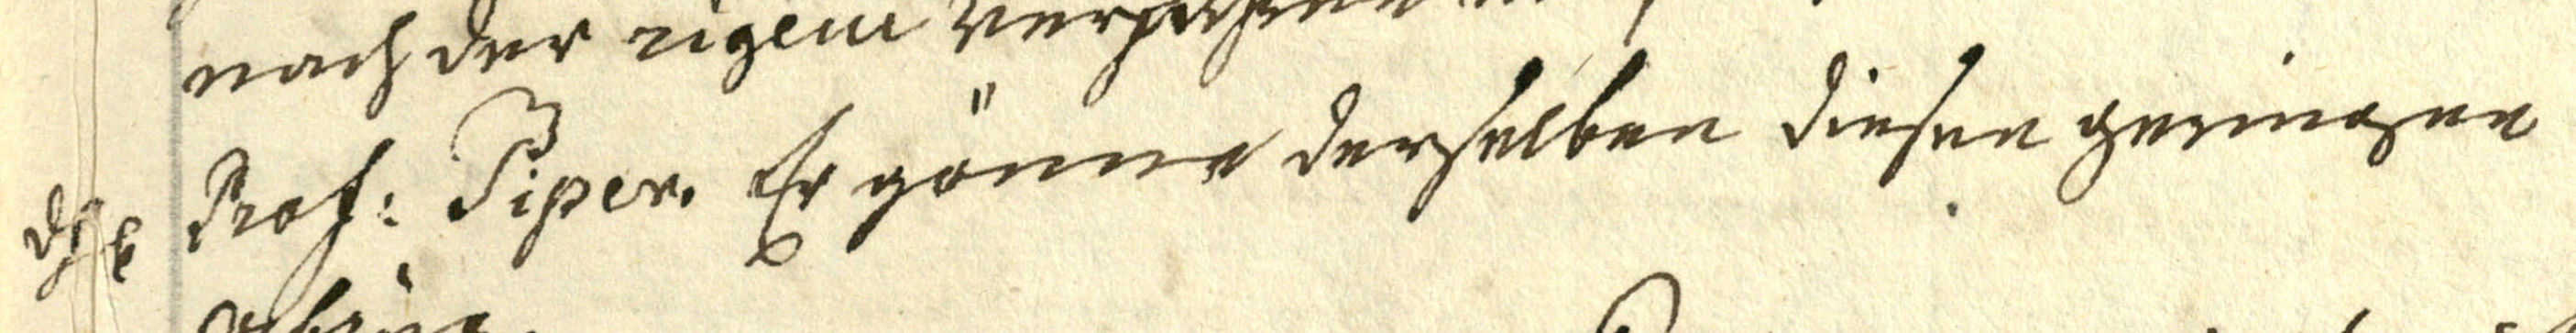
dh Prof. Piper Er gönne derselben diesen geringen
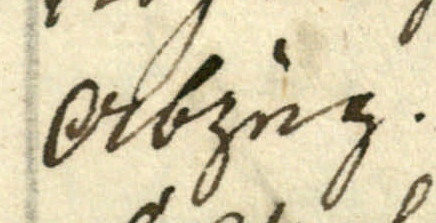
Abzug.
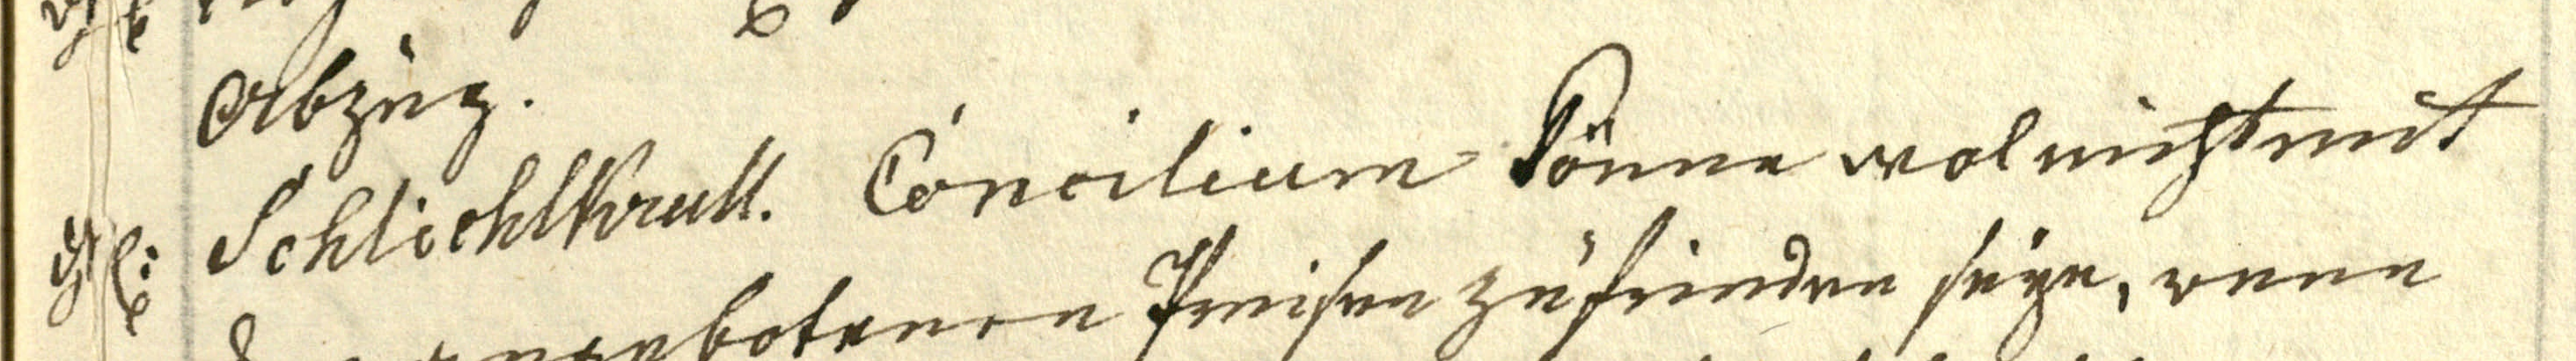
dh. Schlichtkrull. Concilium könne wol nicht mit
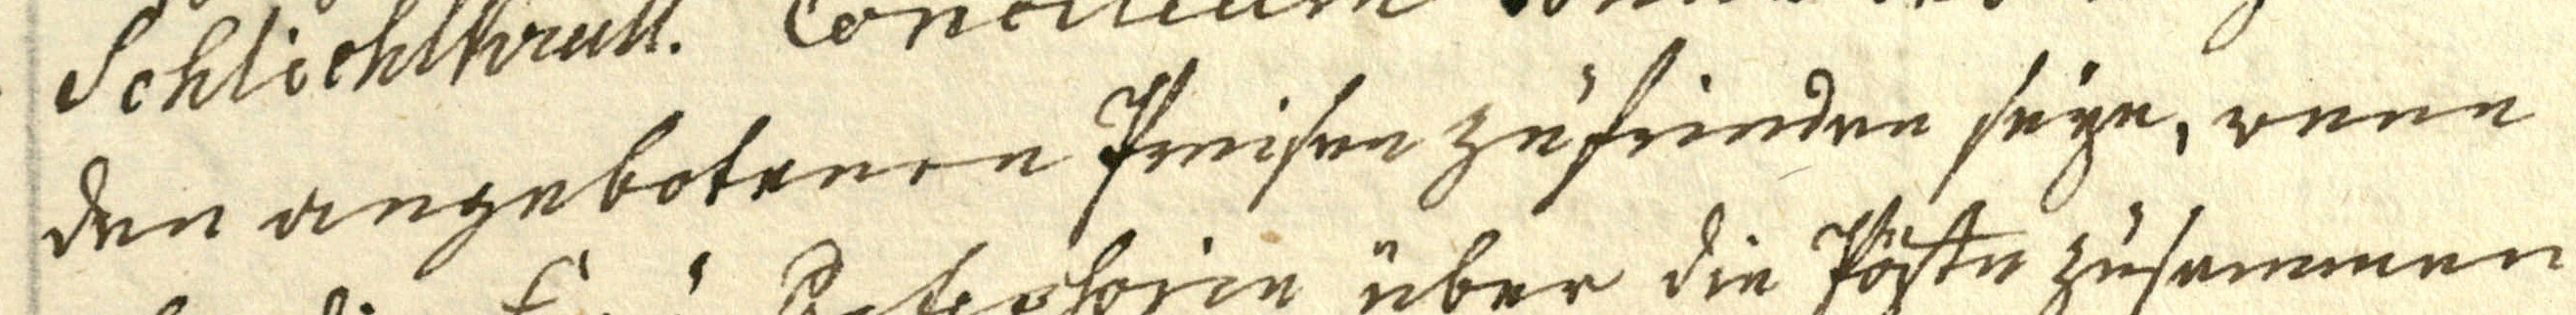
den angebotenen Preisen zufrieden seÿn, wenn
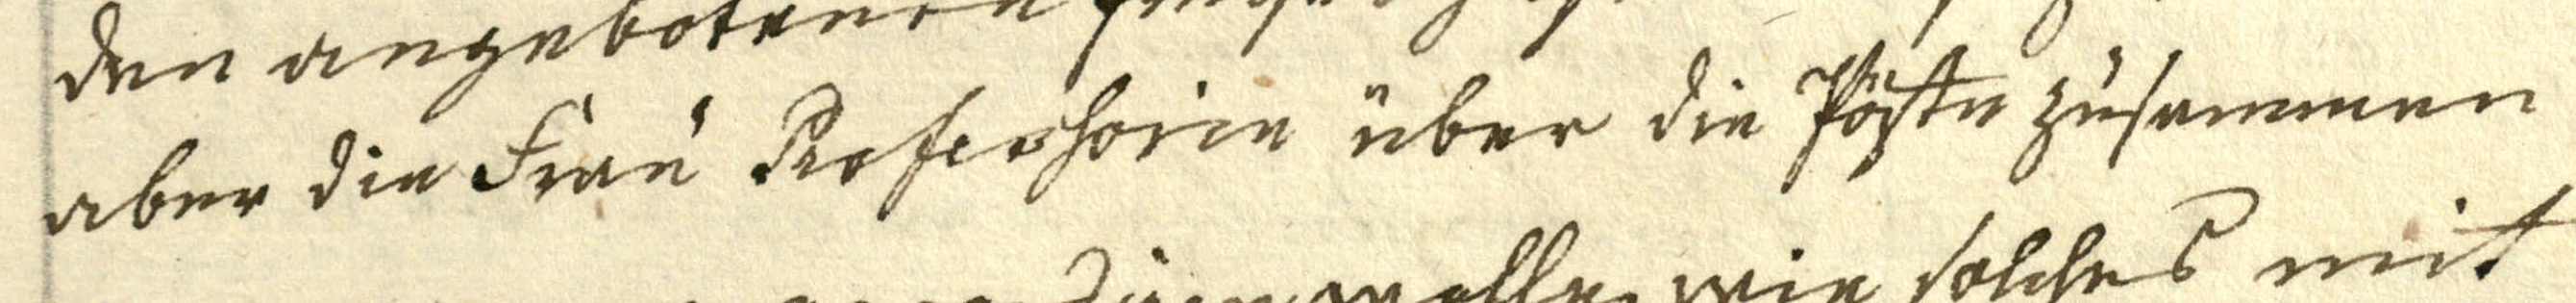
aber die Frau Professorin über die Pöste zusammen
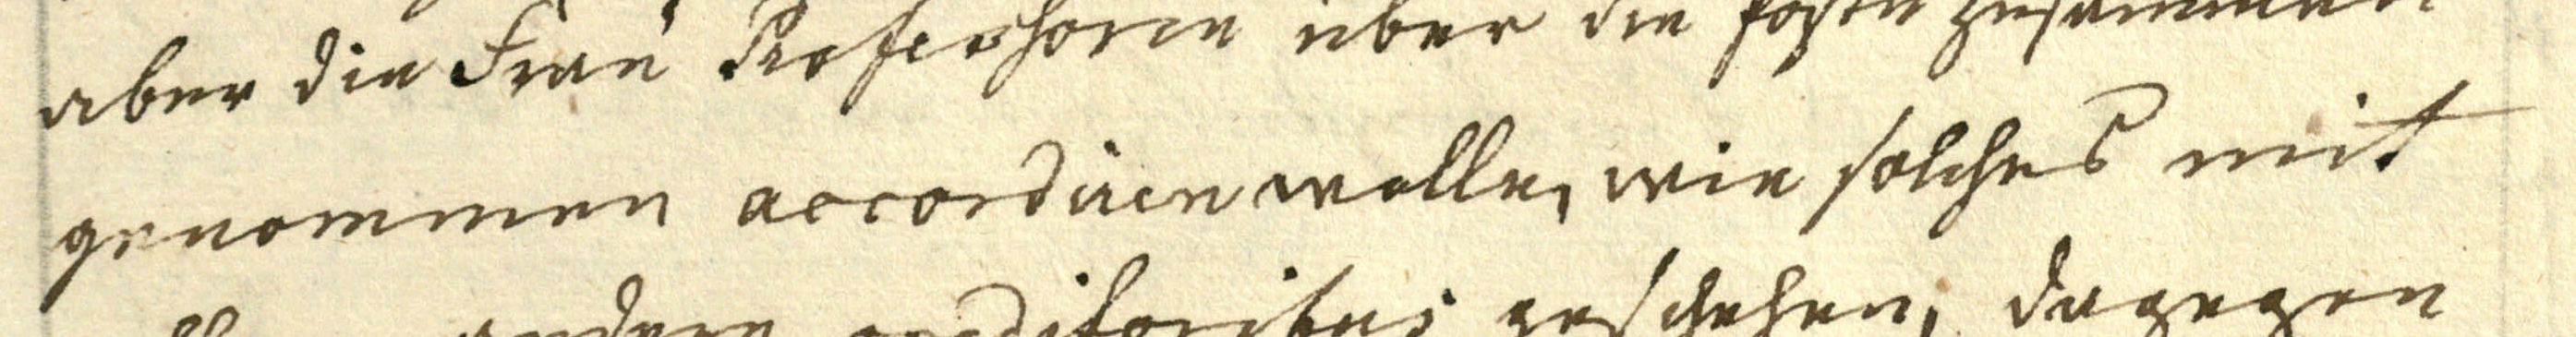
genommen accordiren wolle, wie solches mit
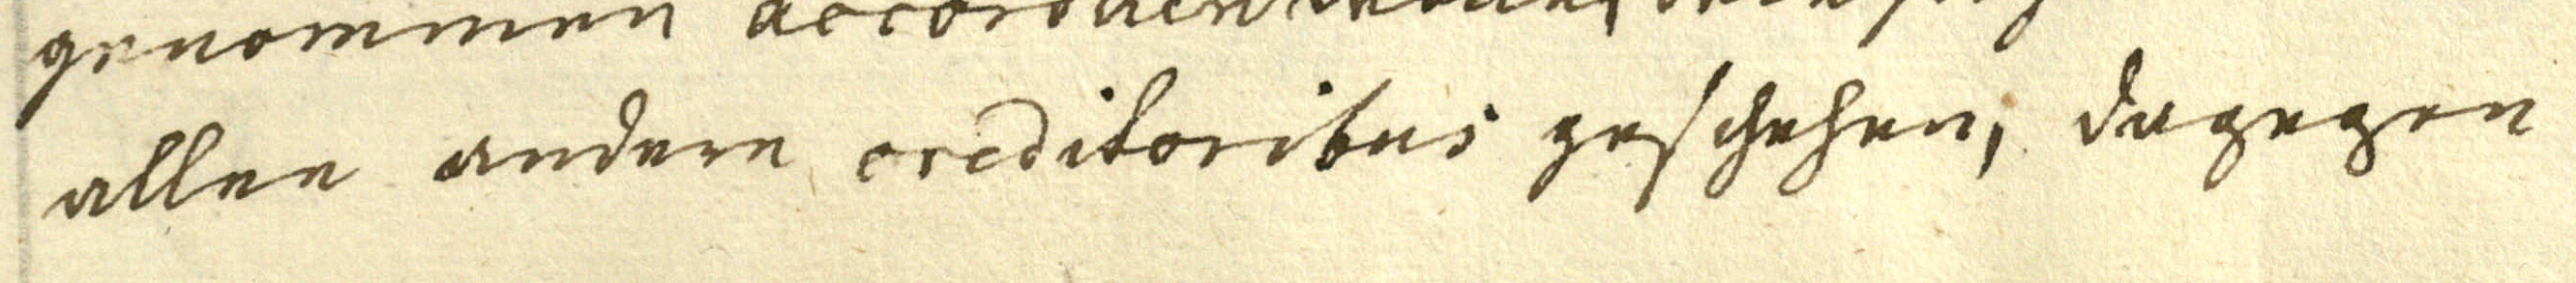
allen andern creditoribus geschehen, dagegen
